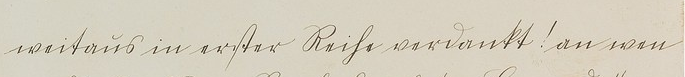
weitaus in erster Reihe verdankt! an wen
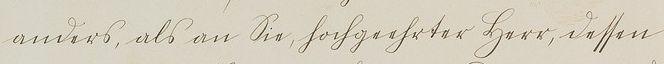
anders, als an Sie, hochgeehrter Herr, dessen
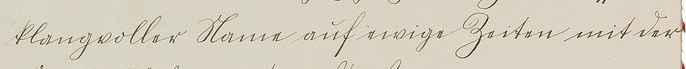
klangvoller Name auf ewige Zeiten mit der
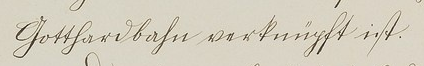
Gotthardbahn verknüpft ist.
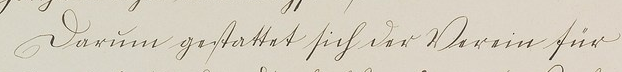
Darum gestattet sich der Verein für
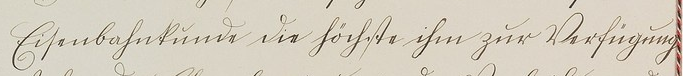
Eisenbahnkunde die höchste ihm zur Verfügung
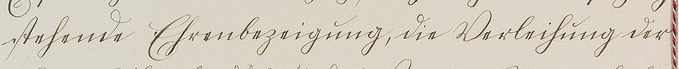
stehende Ehrenbezeigung, die Verleihung der
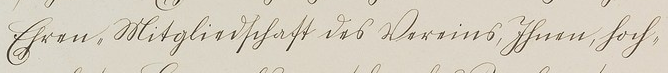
Ehren-Mitgliedschaft des Vereins, Ihnen, hoch-
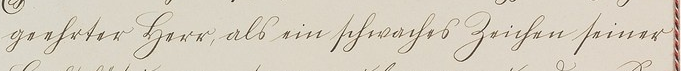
geehrter Herr, als ein schwaches Zeichen seiner
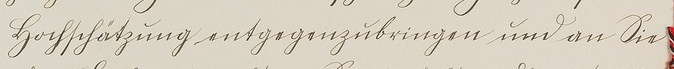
Hochschätzung entgegenzubringen und an Sie
